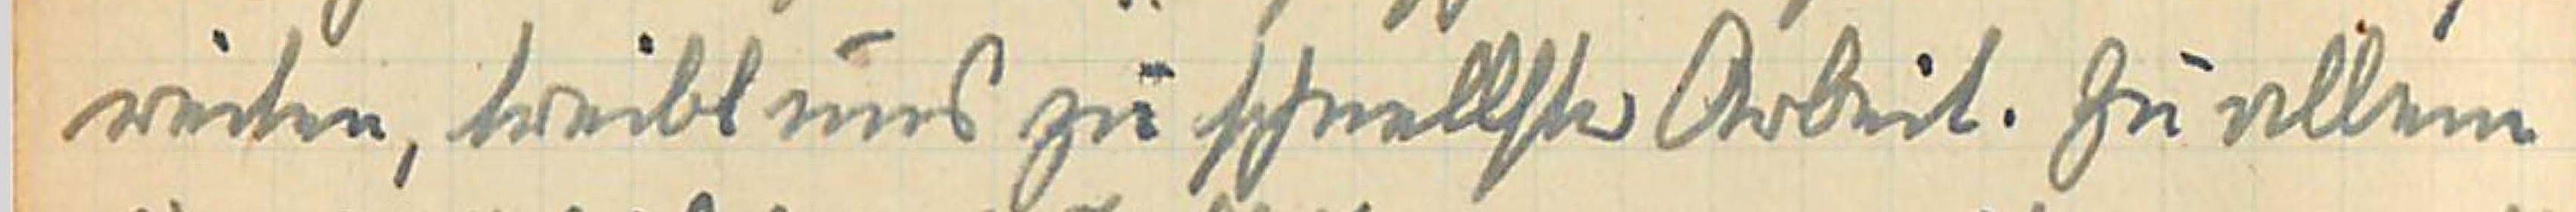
reiten, treibt uns zu schnellster Arbeit. Zu allem
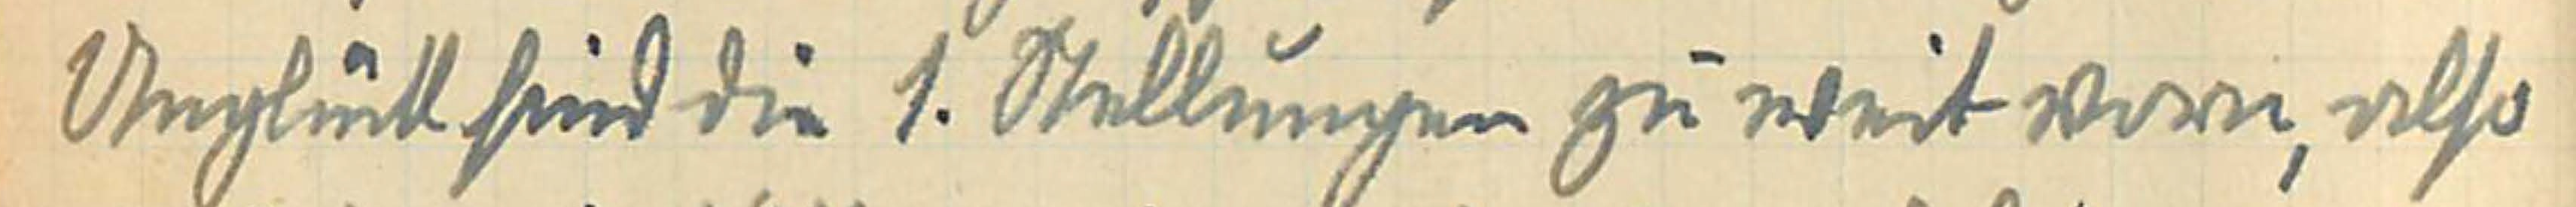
Unglück sind die 1. Stellungen zu weit vorn, also
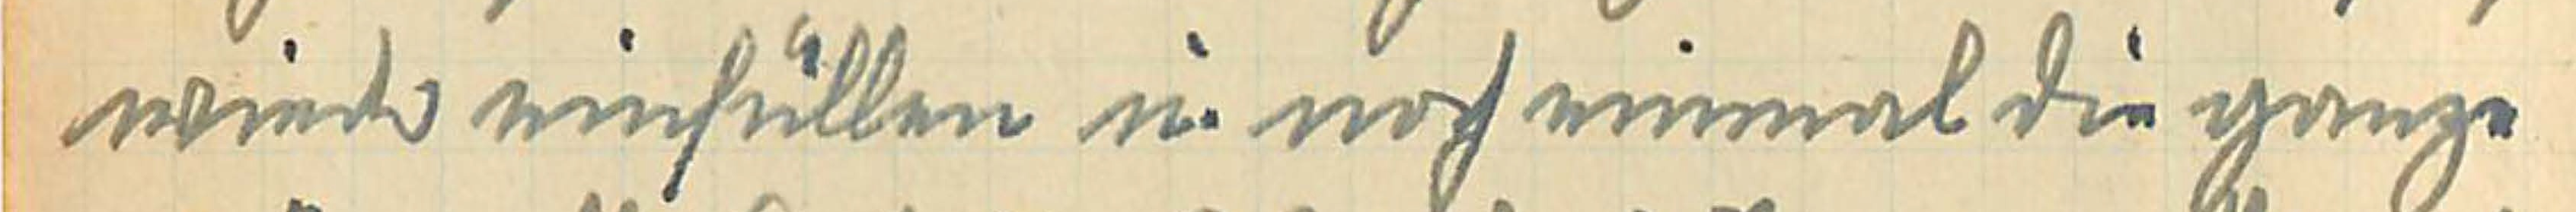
wieder einfüllen u. noch einmal die ganze
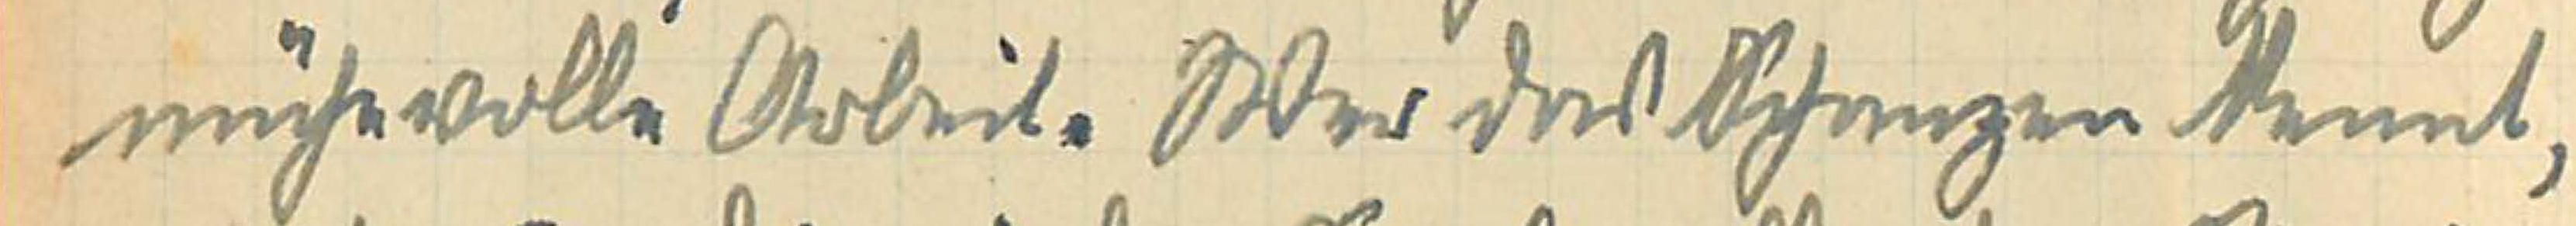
mühevolle Arbeit. Wer das Schanzen kennt,
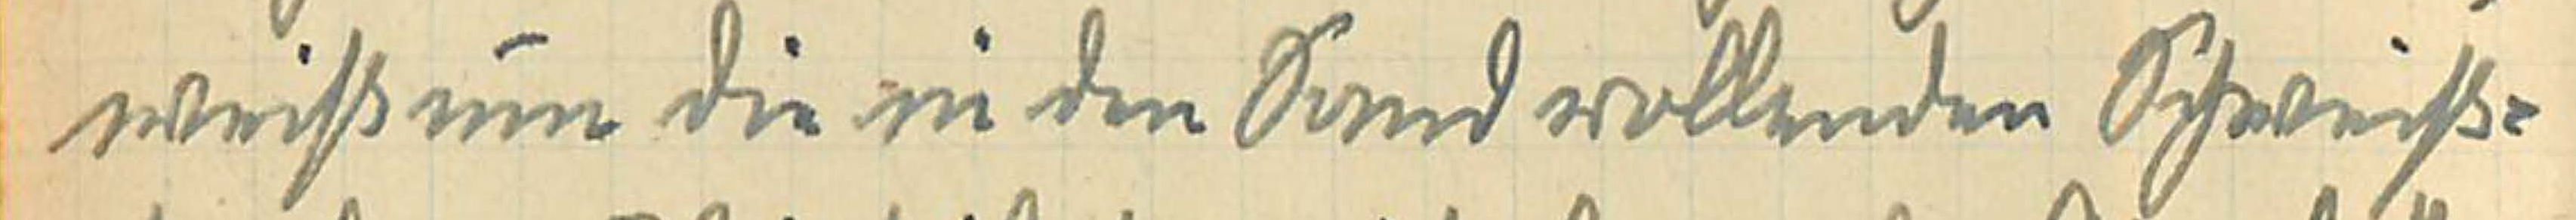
weiß um die in den Sand rollenden Schweiß-
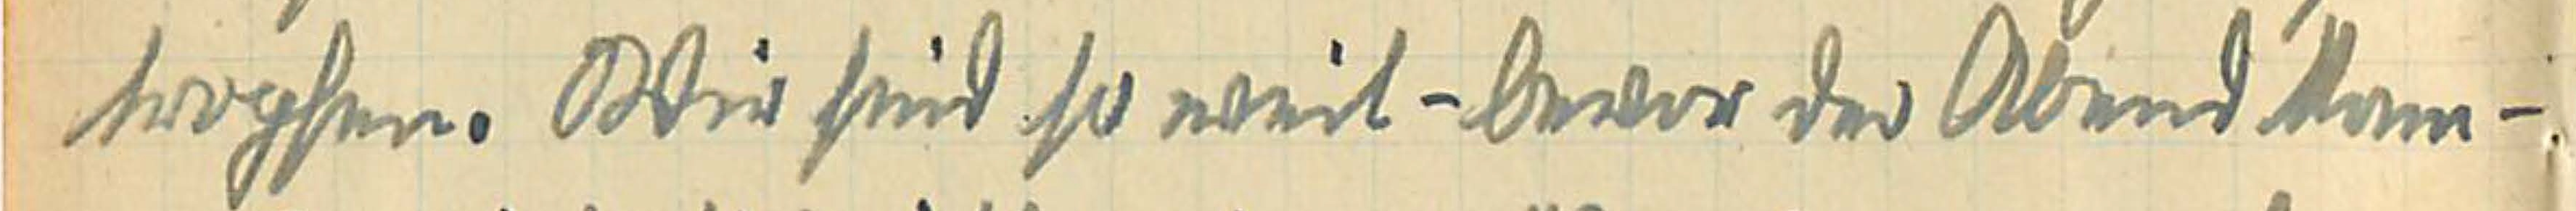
tropfen. Wir sind so weit – bevor der Abend kam –
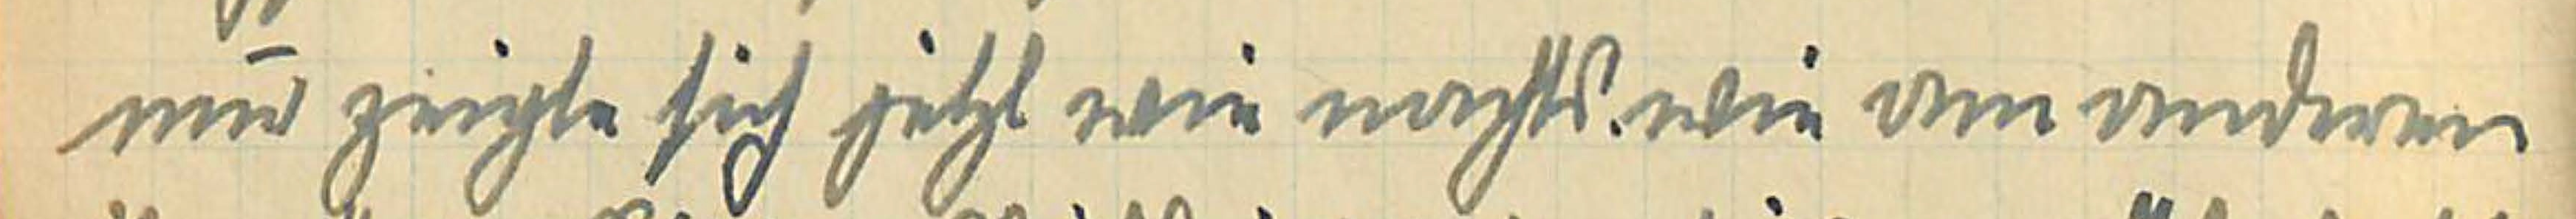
nur zeigte sich jetzt wie nachts wie am anderen
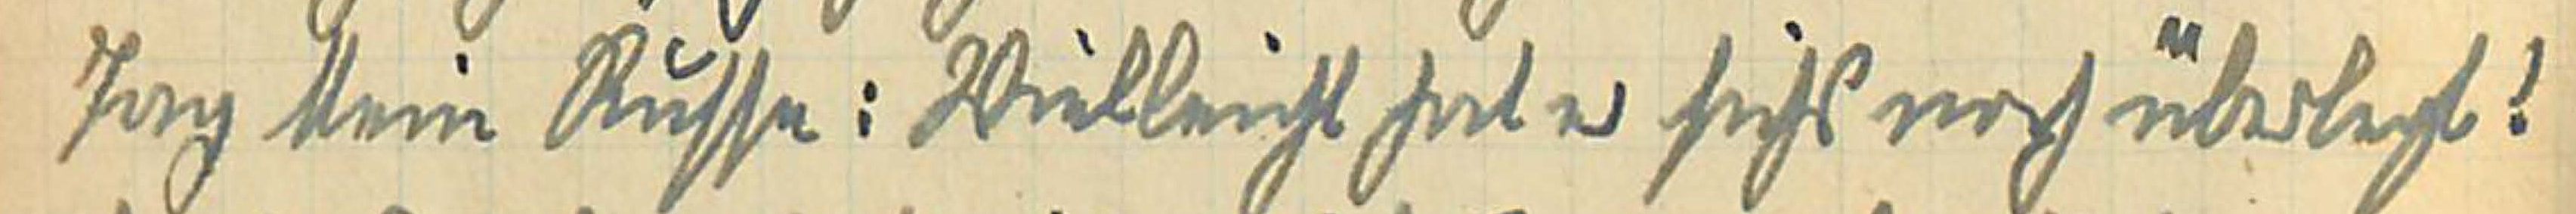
Tag kein Russe: Vielleicht hat er sichs noch überlegt?
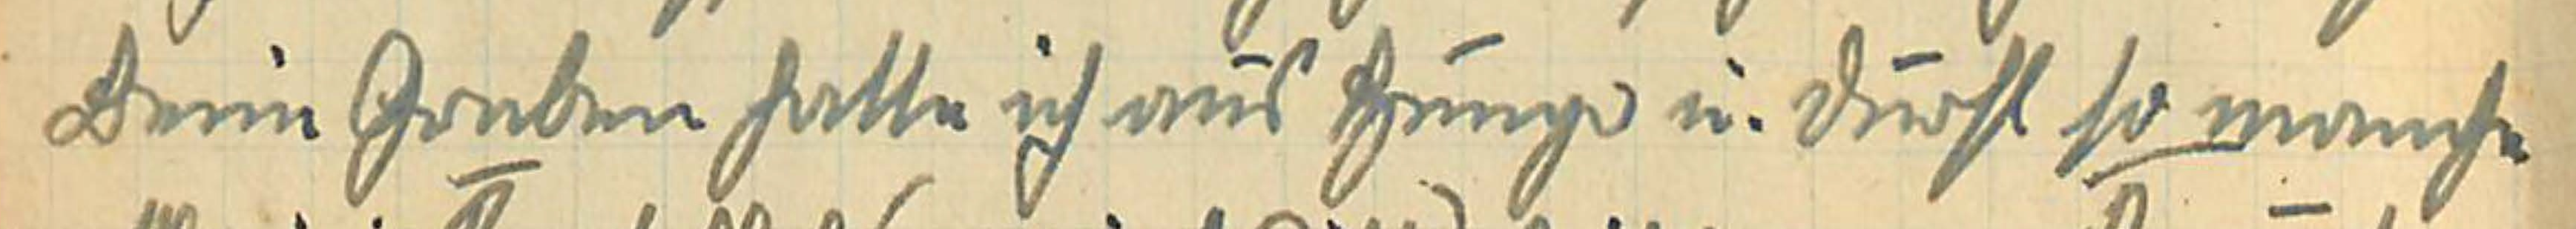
Beim Graben hatte ich aus Hunger u. Durst so manche
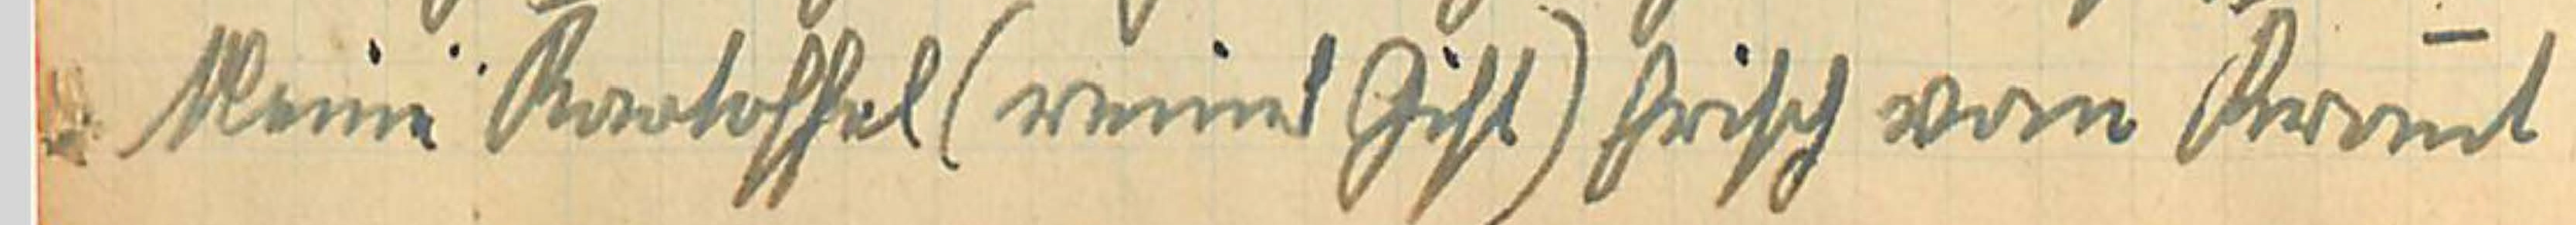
kleine Kartoffel (reines Gift) frisch vom Kraut
